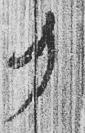人
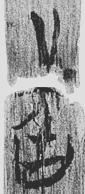者
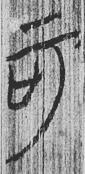可（何）
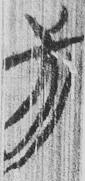必
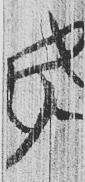𡚦
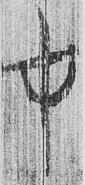才（哉）
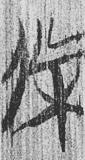傑（桀）
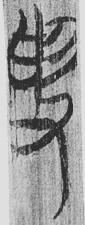受（紂）
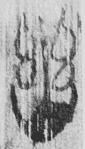幽
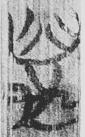萬（厲）
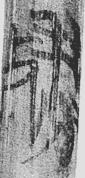{歺翏}（戮）
